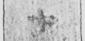十
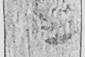三
